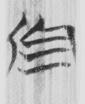於
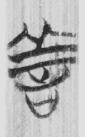善
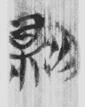則
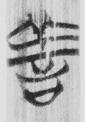善
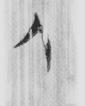人
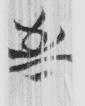至
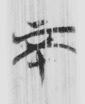不
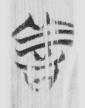善
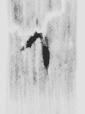人
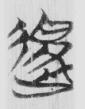退
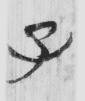子
